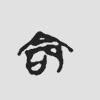命
